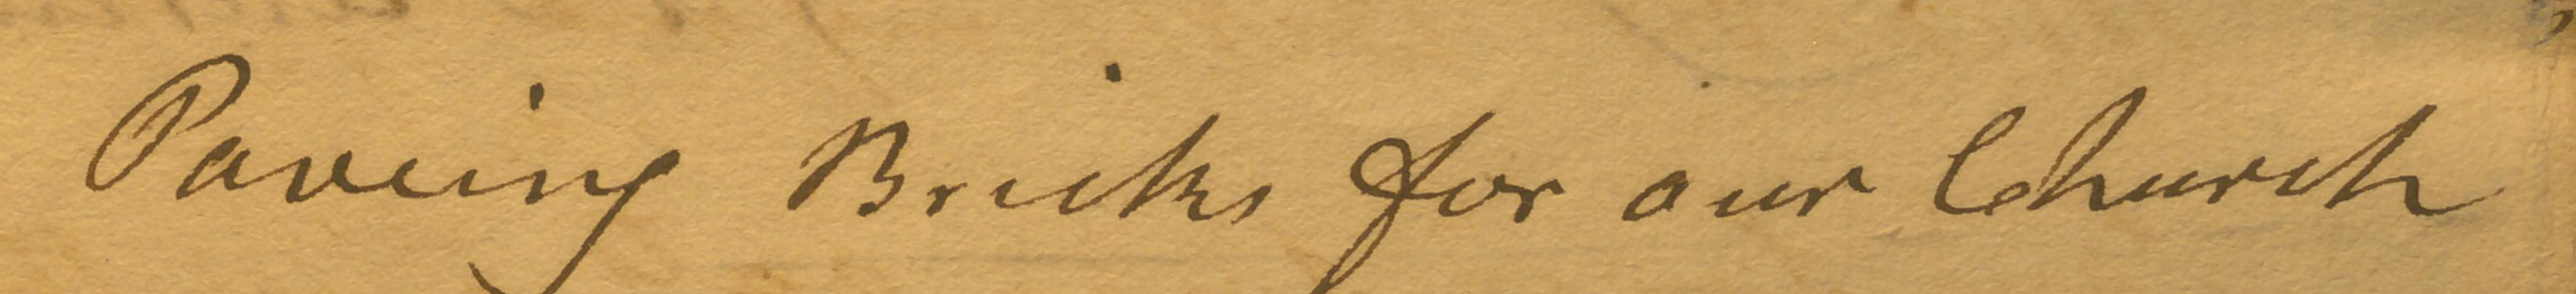Paveing Bricks for our Church
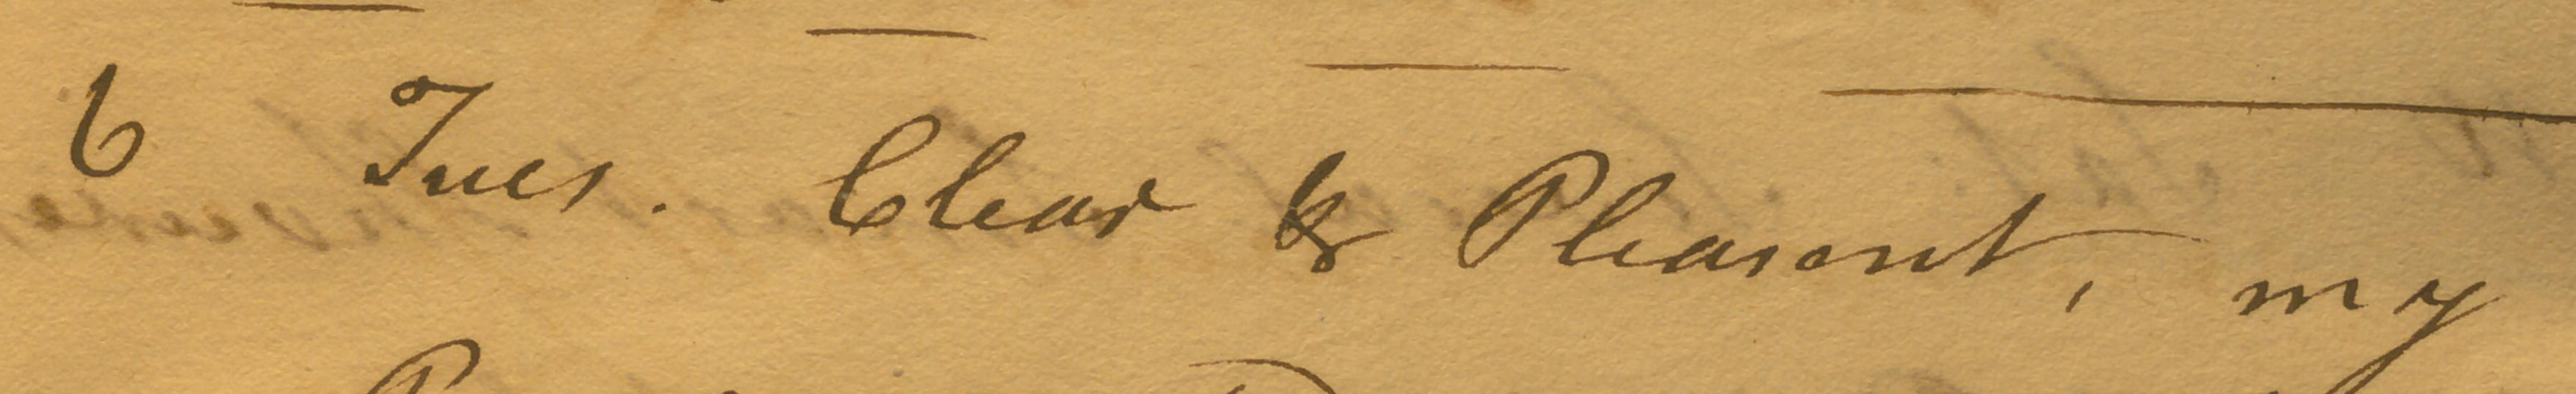6 Tues. Clear & Pleasent, my
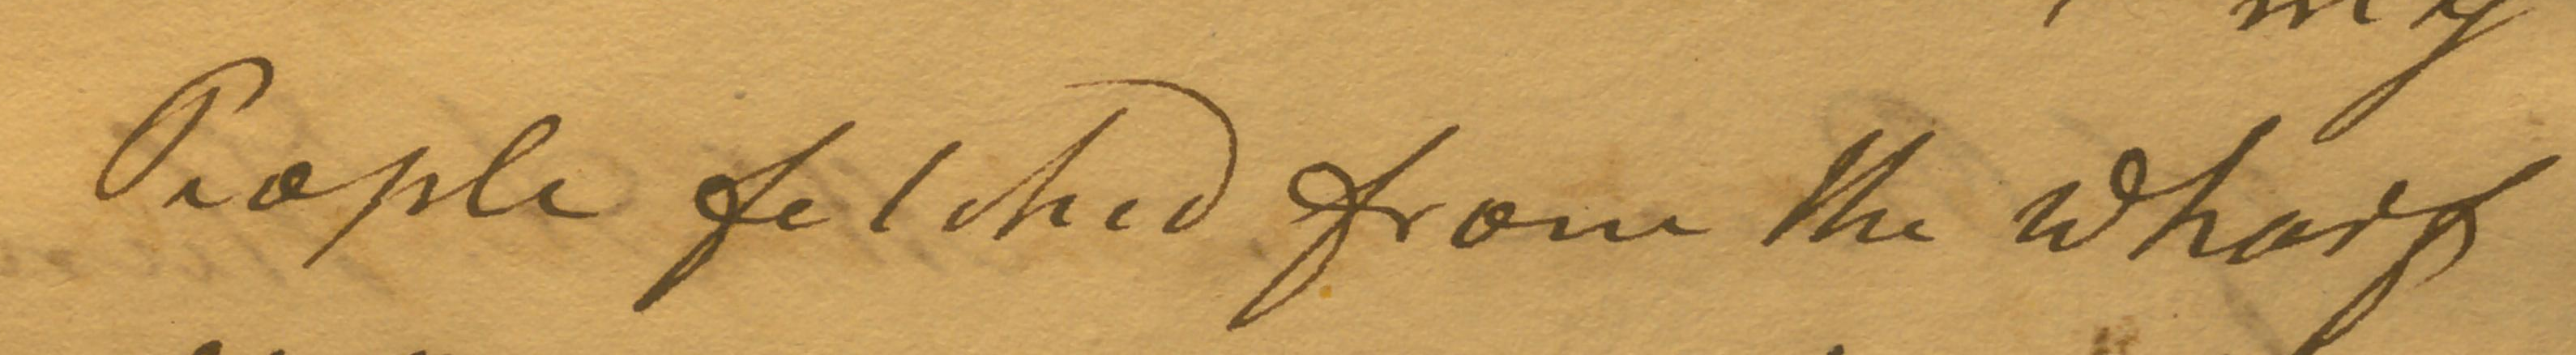People fetched from the wharf
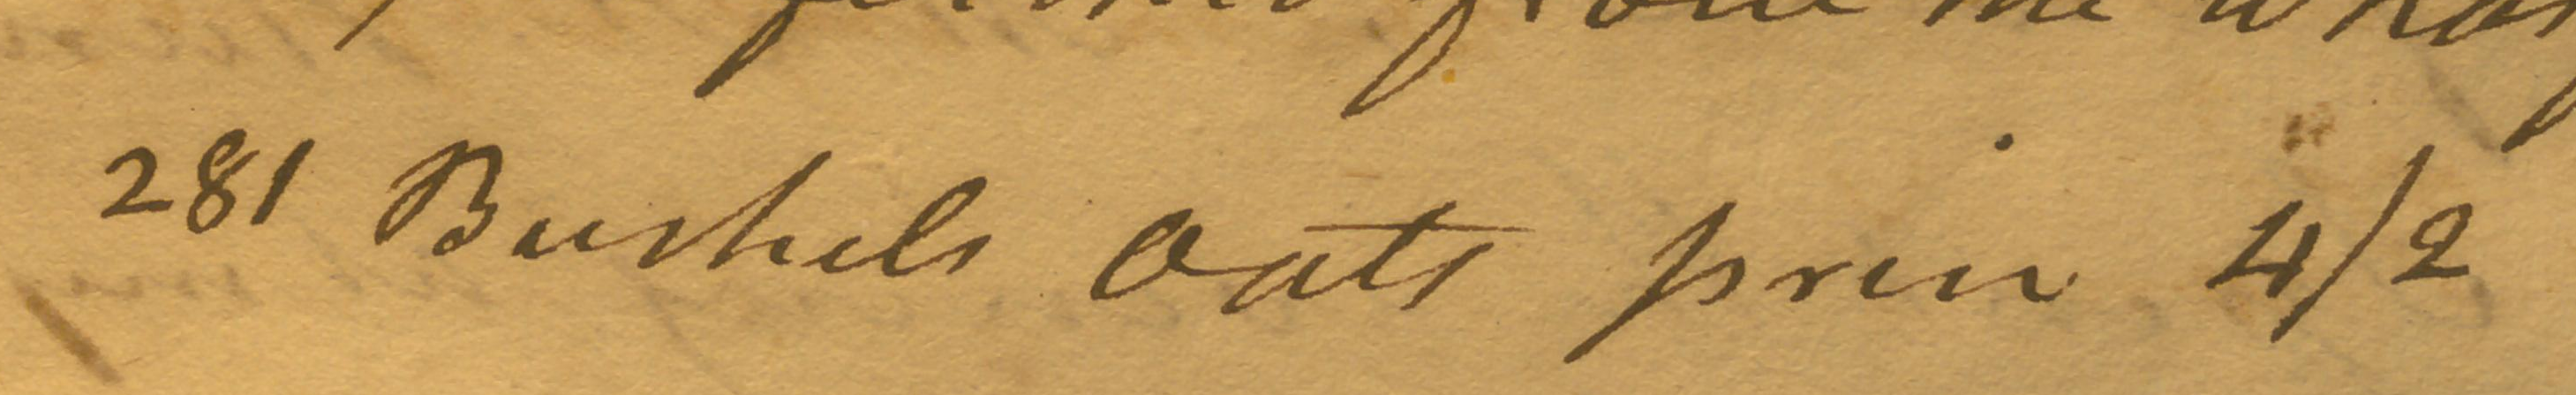281 Bushels Oats price 4s2
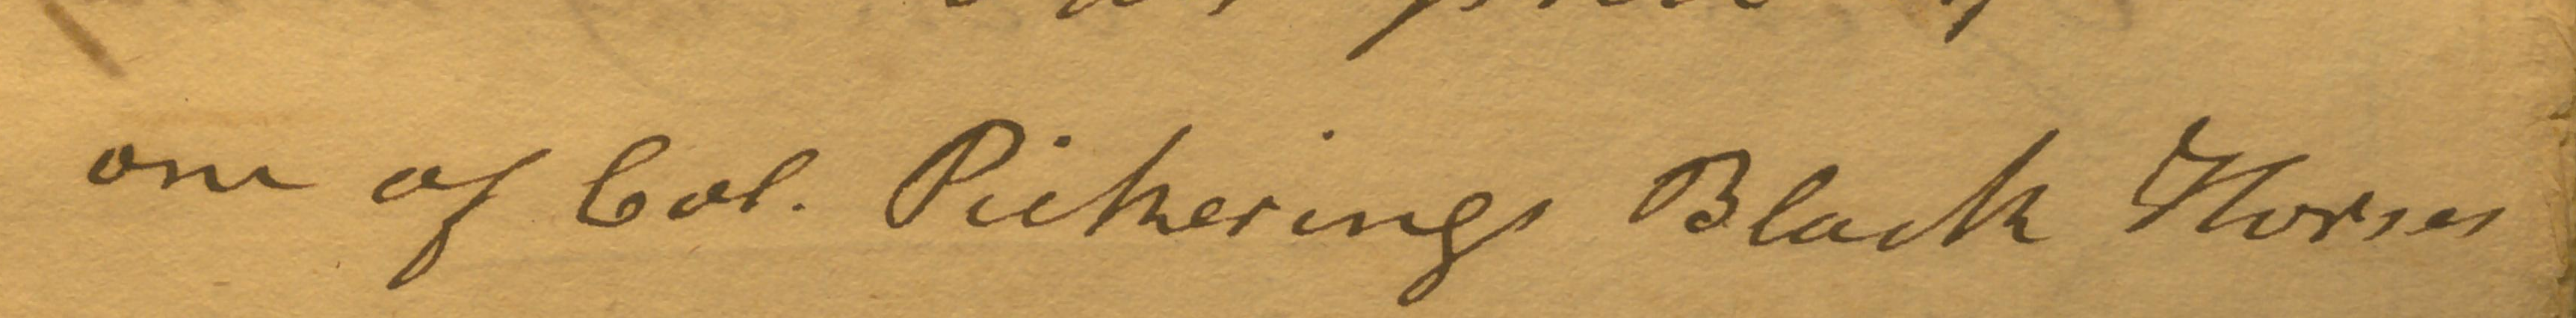one of Col. Pickerings Black Horses
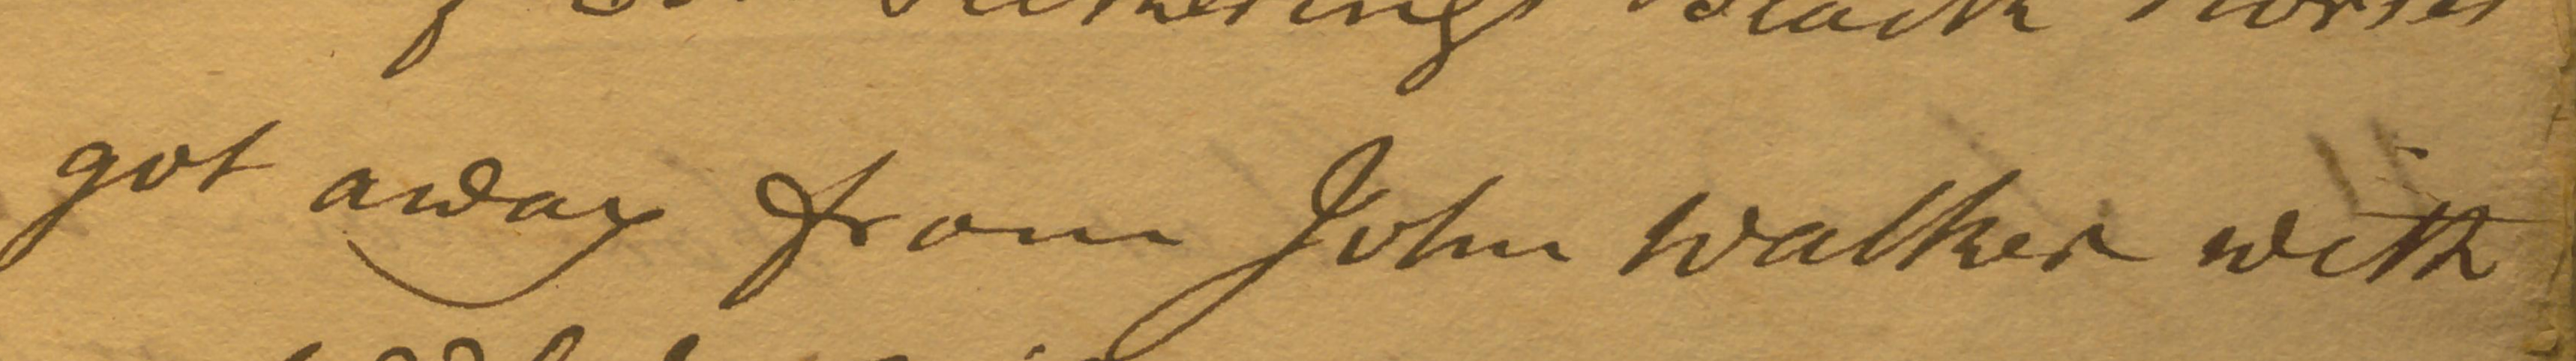got away from John walker with
